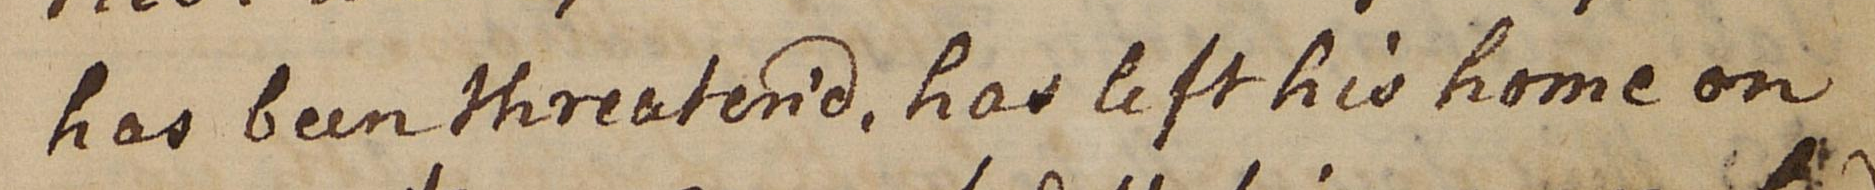has been threaten'd, has left his home on
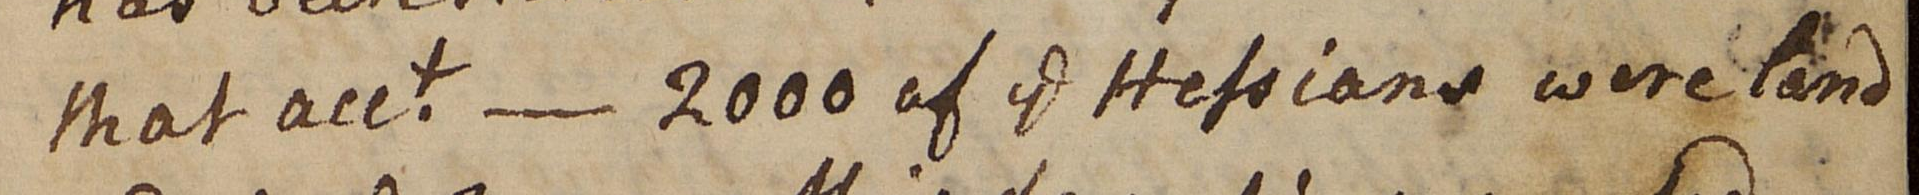that acc^t.- 2000 of y^e Hessians were land
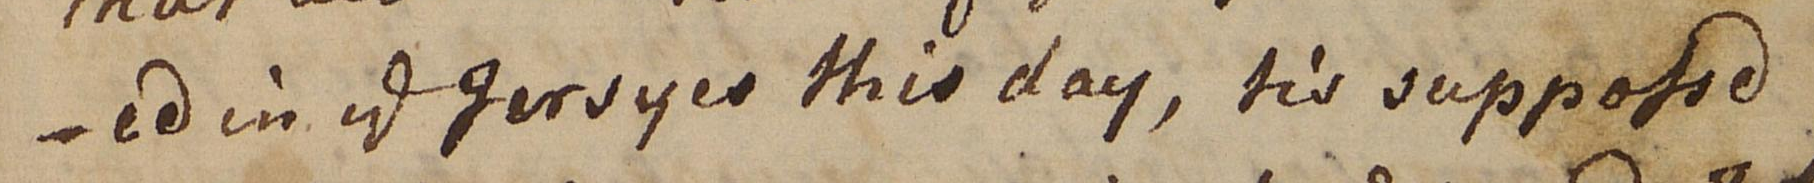-ed in y^e Jersyes this day, tis suppossd
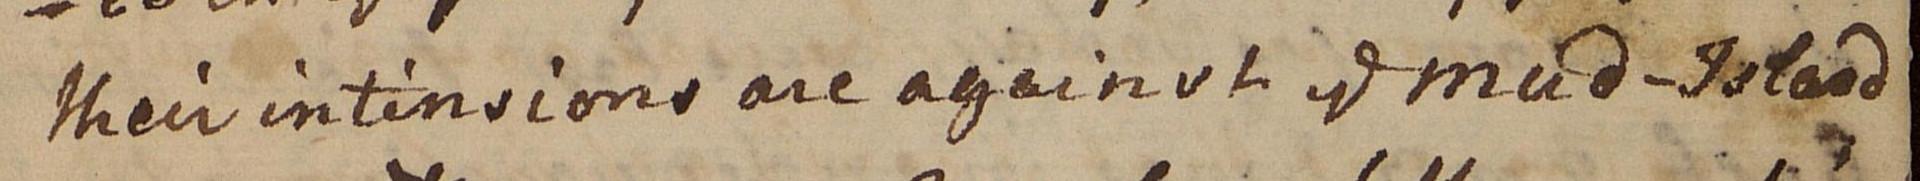their intensions are against y^e mud-Island
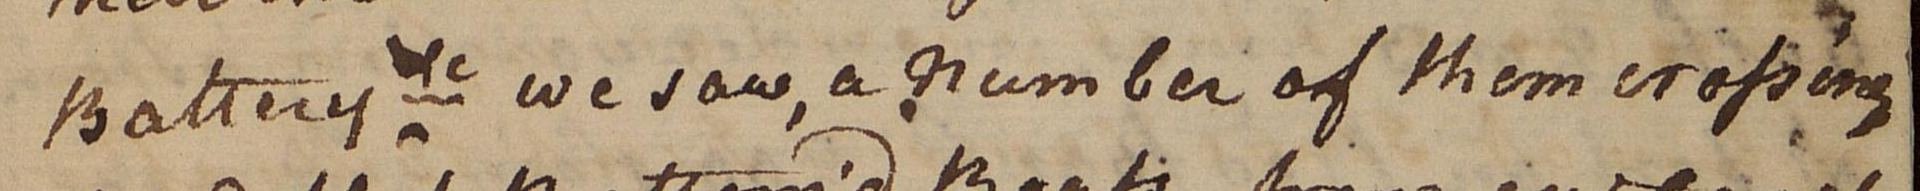Battery ^&c- we saw, a Number of them crossing
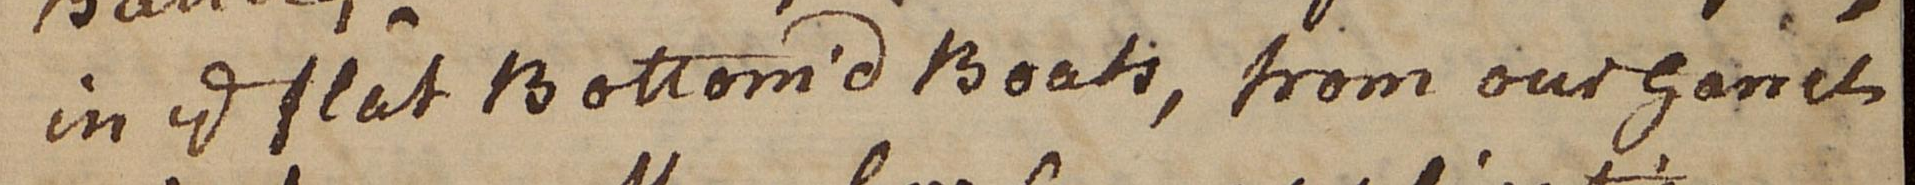in y^e flat Bottom'd Boats, from our Garret
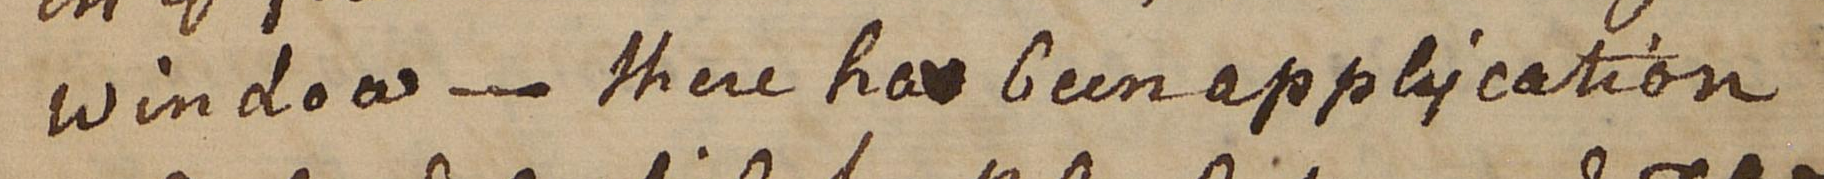Window - there has been application
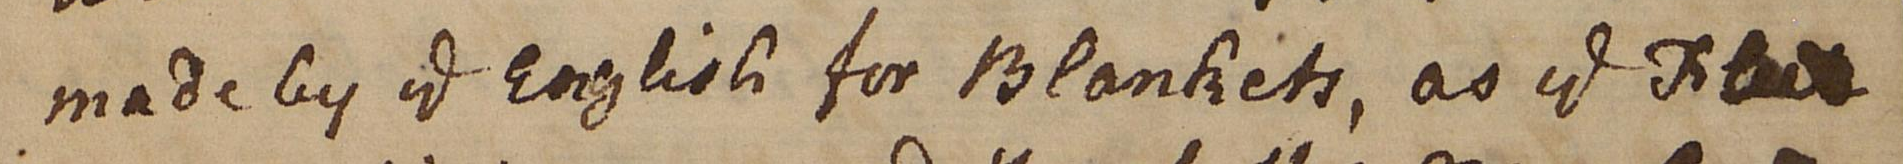made by y^e English for Blankets, as y^e Flux
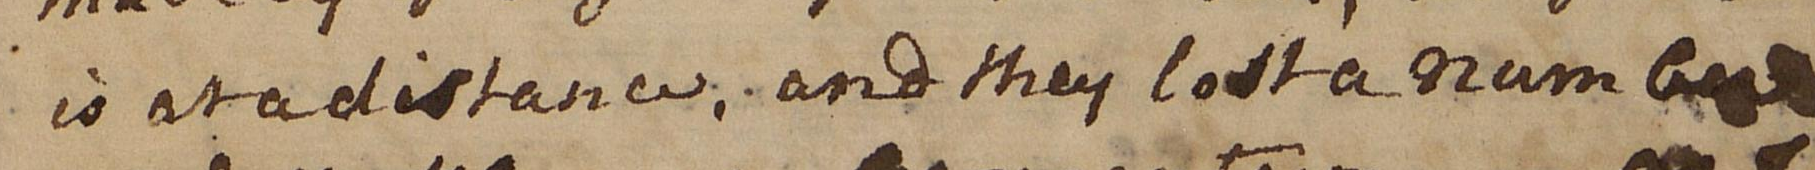is at a distance, and they lost a number
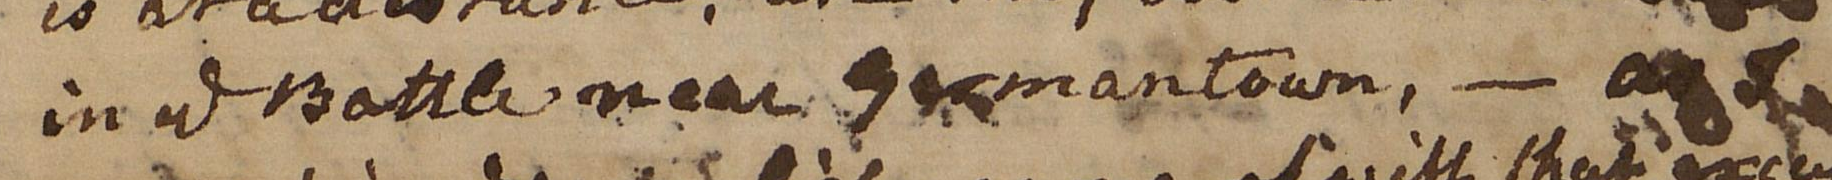in y^e Battle near Germantown,- as I
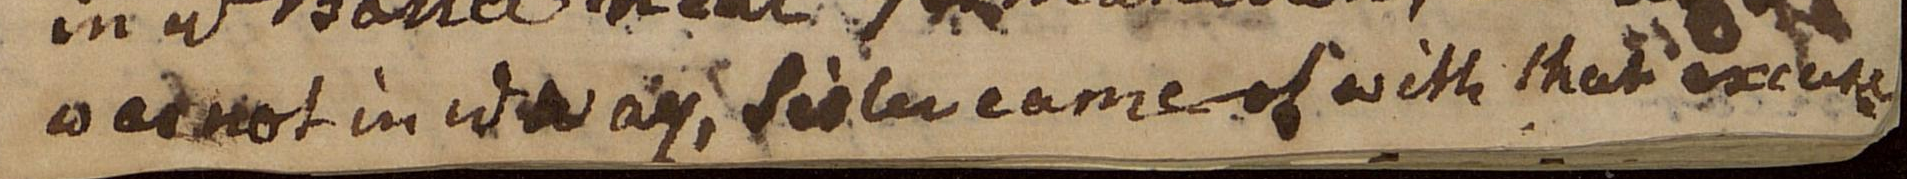was not in y^e way, Sister came of with that excuse
